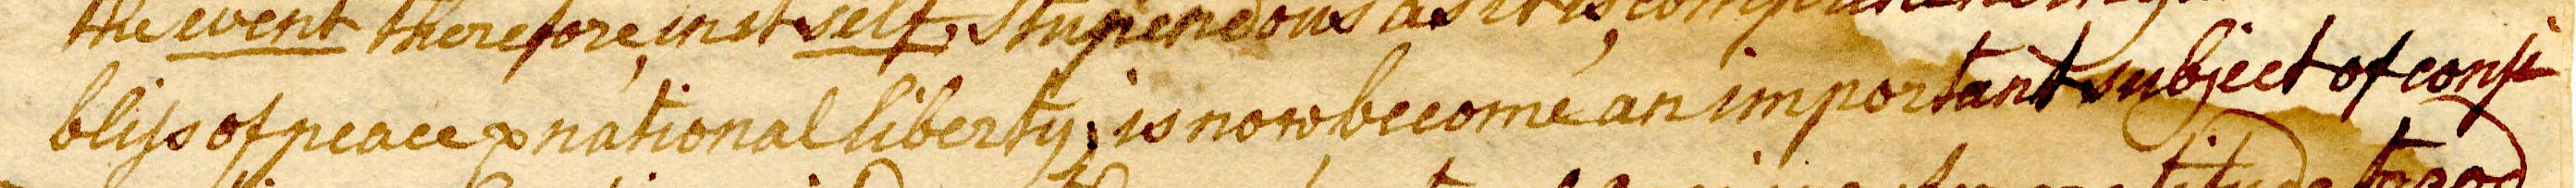bliss of peace & national liberty; is now become an important subject of consi
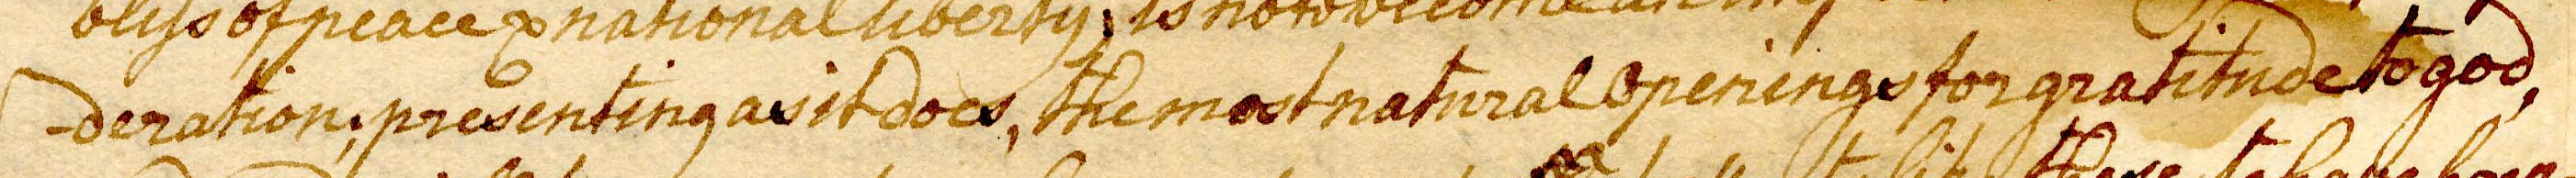-deration, presenting as it does, the most natural openings for gratitude to god,
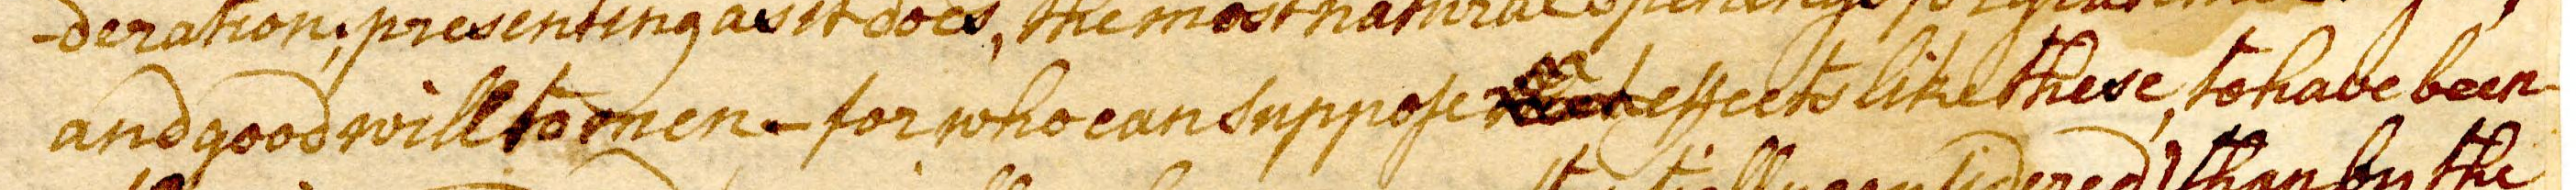and good will to men- for who can suppose [____] effects like these, to have been
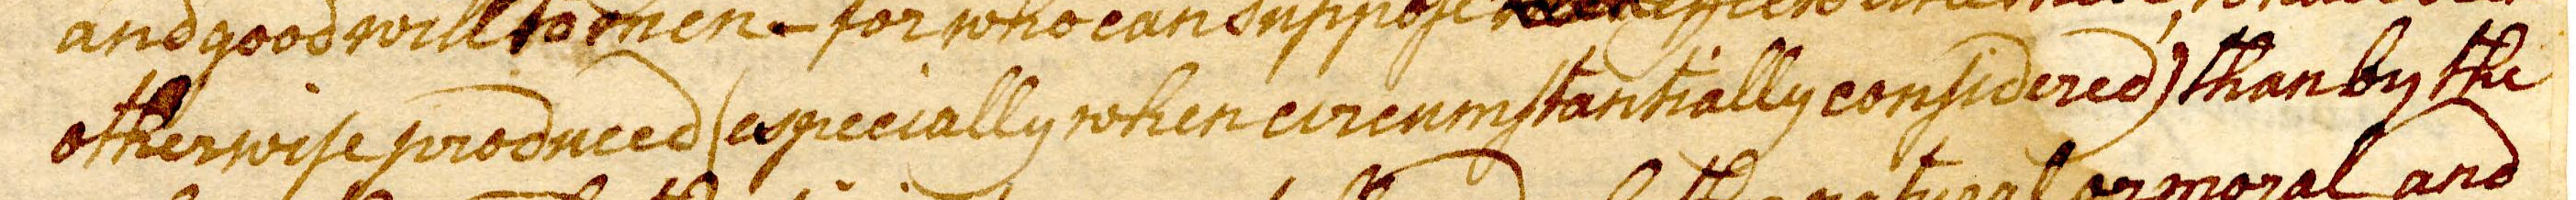otherwise produced (especially when circumstantially considered) than by the
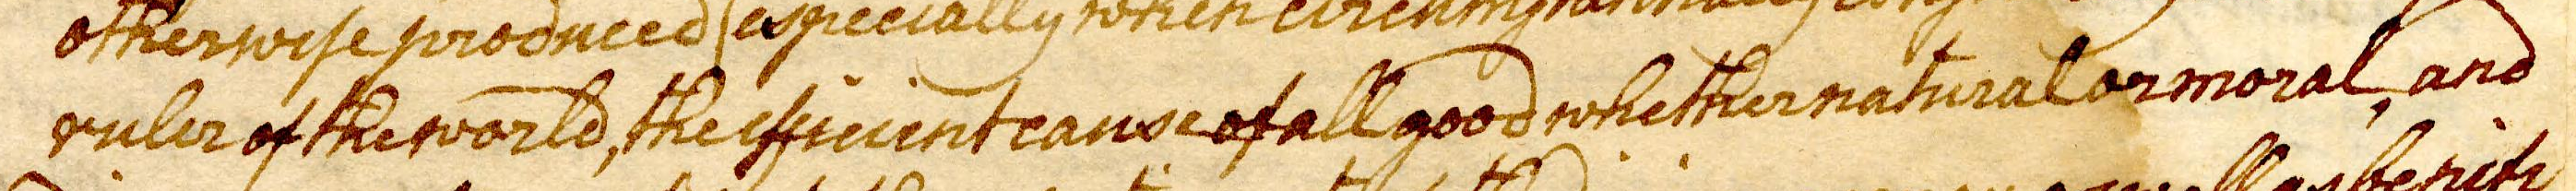ruler of the world, the efficient cause of all good whether natural or moral, and
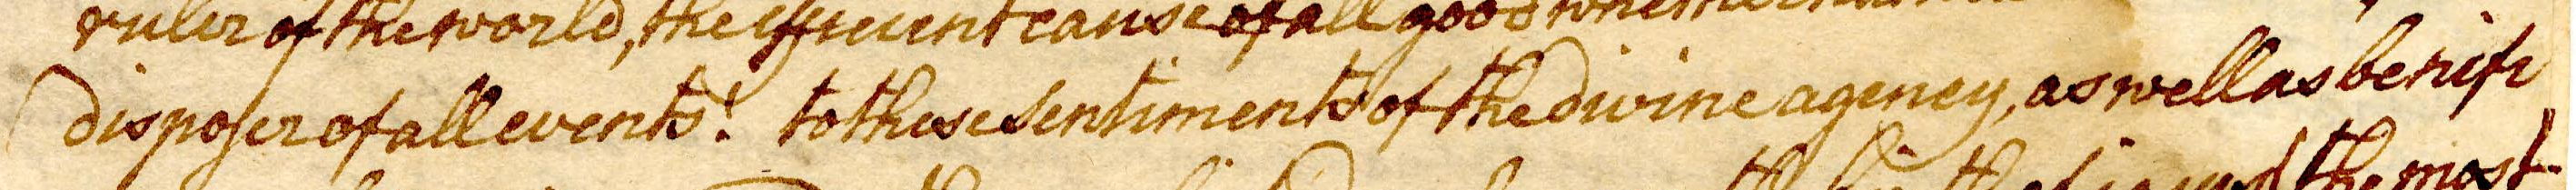disposer of all events? to these sentiments of the divine agency, as well as benifi
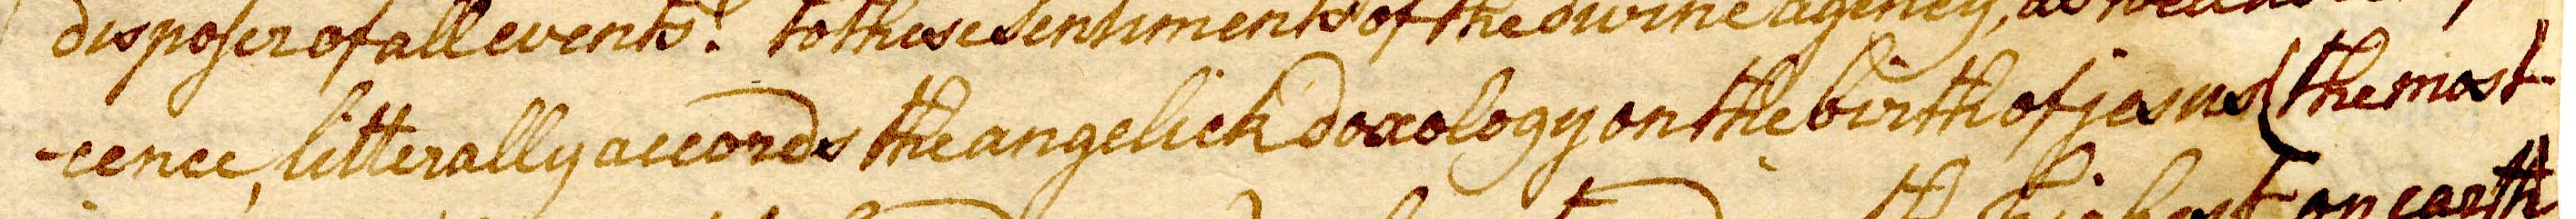-cence, litterally accords the angelick doxology on the birth of jesus (the most
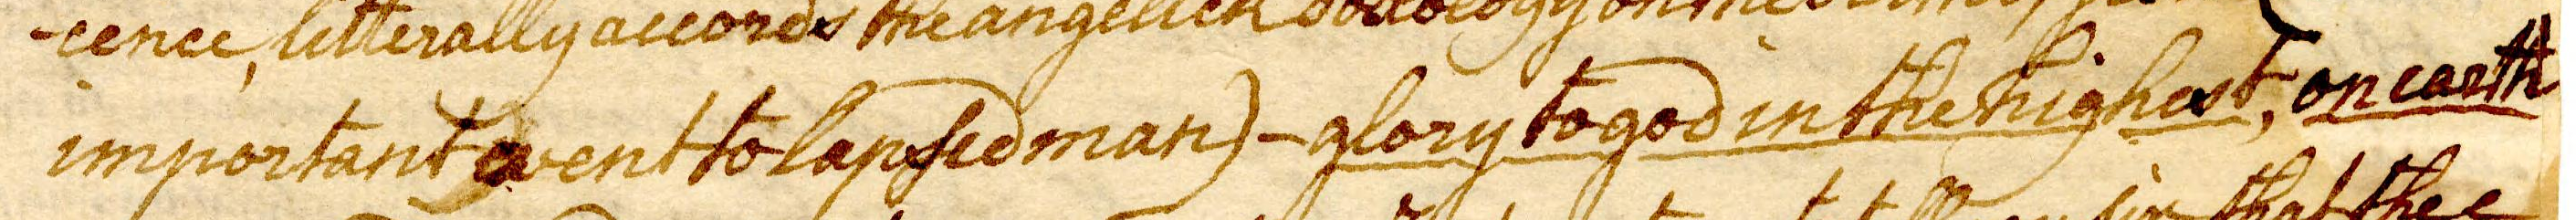important event to lapsed man)- glory to god in the highest, on earth
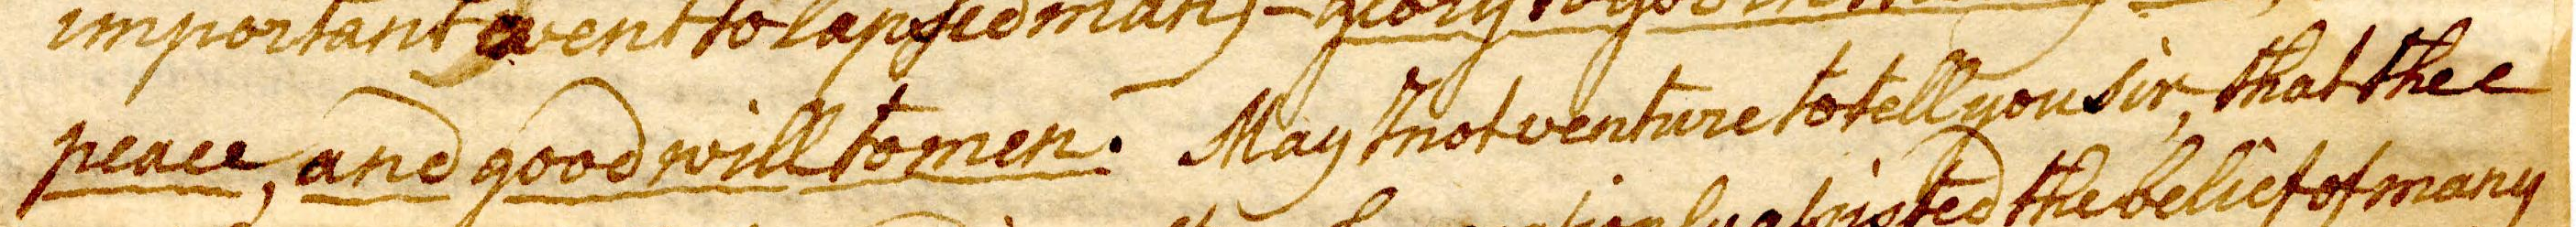peace, and good will to men. May I not venture to tell you sir, that the e
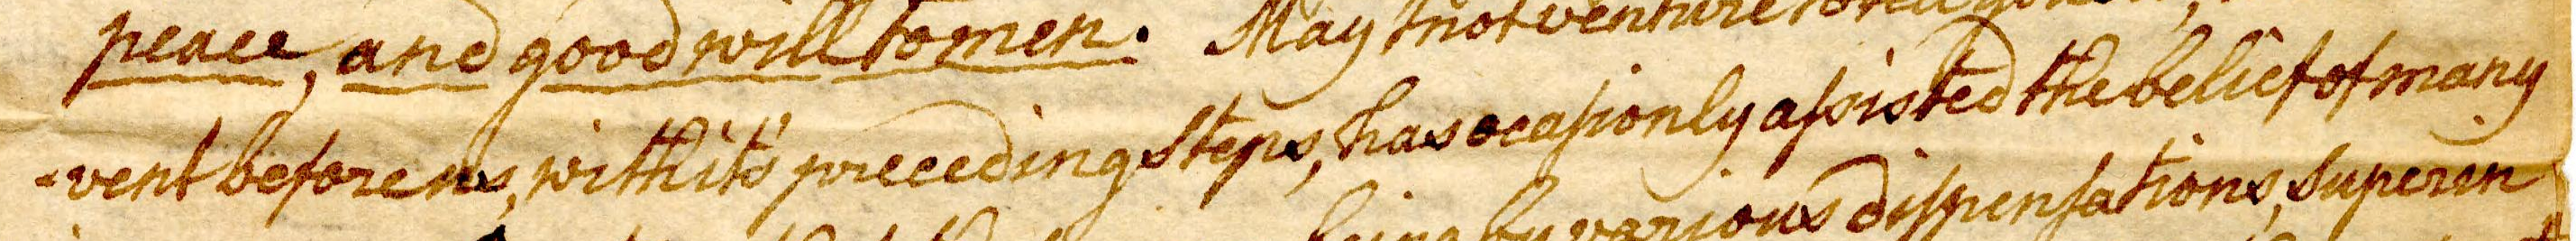-vent before us, with it's preceding Steps, has ocasionly assisted the belief of many
